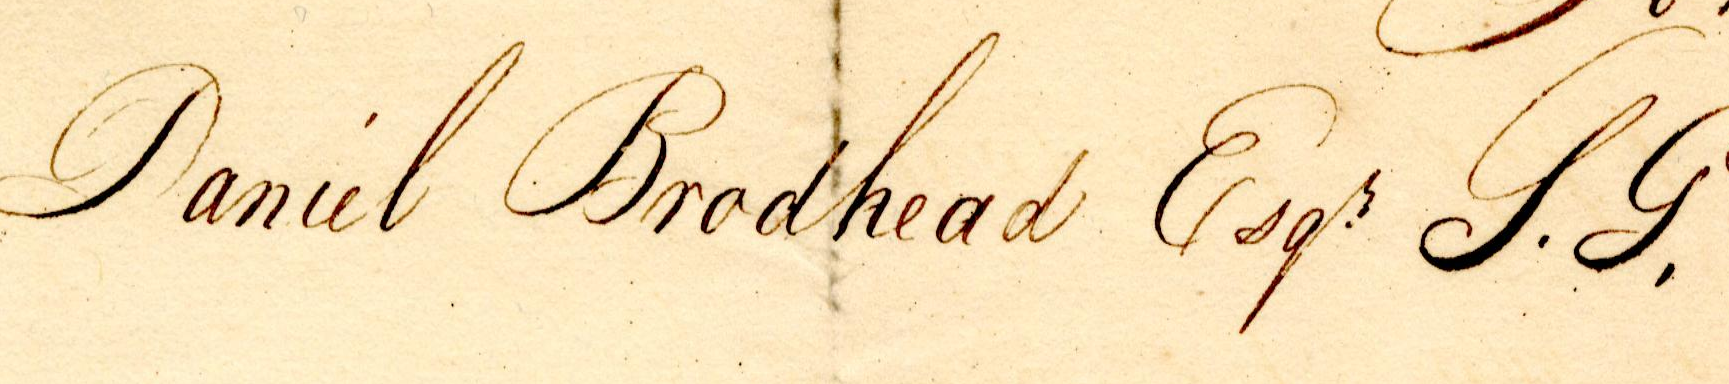Daniel Brodhead Esq^r S.G
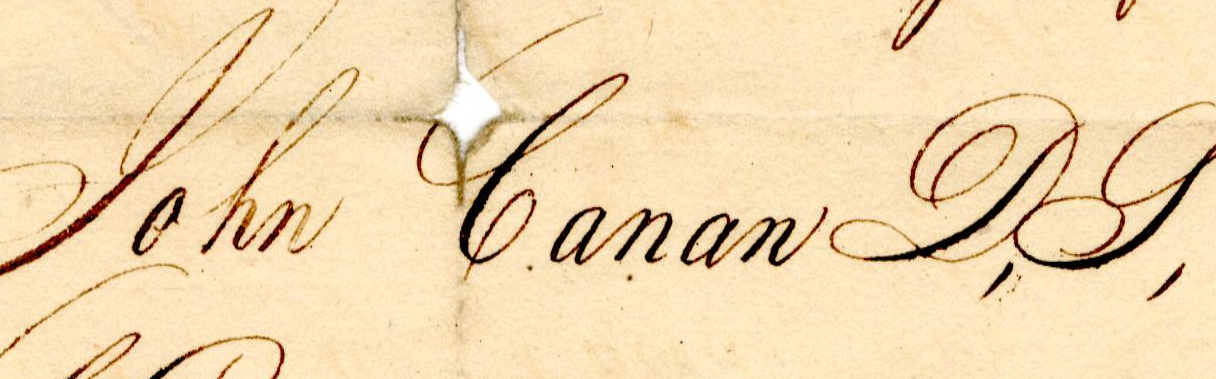John Canan D.S.
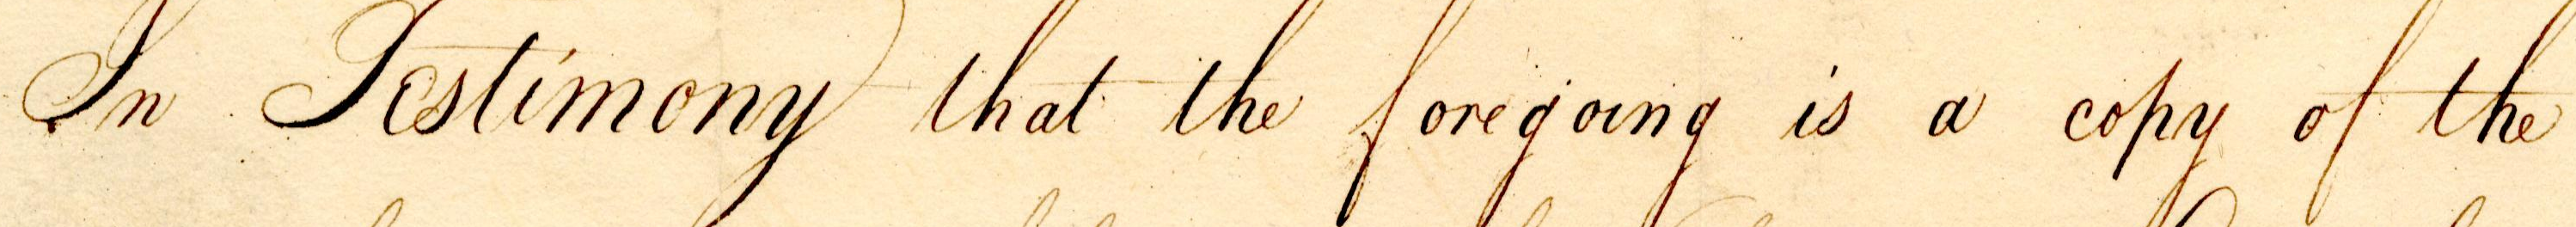In Testimony that the foregoing is a copy of the
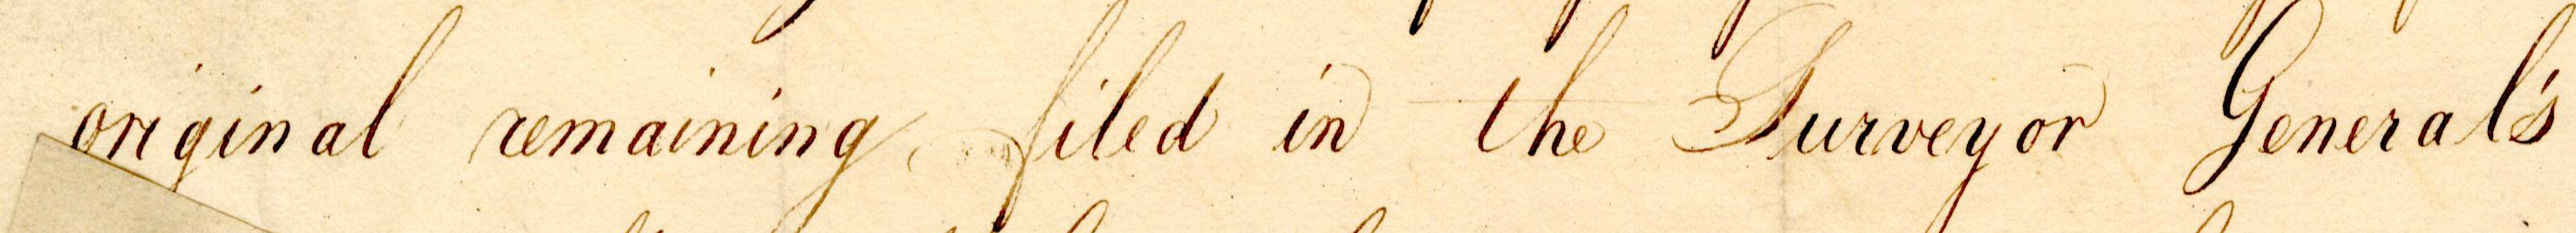original remaining filed in the Surveyor General's
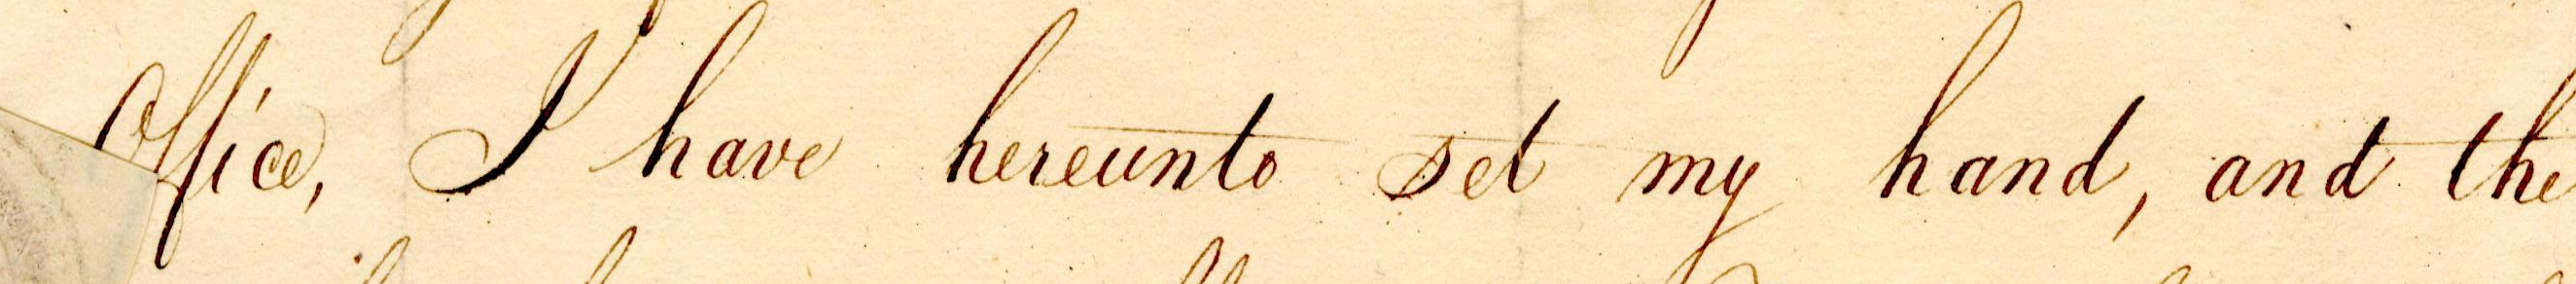Office, I have hereunto set my hand, and the
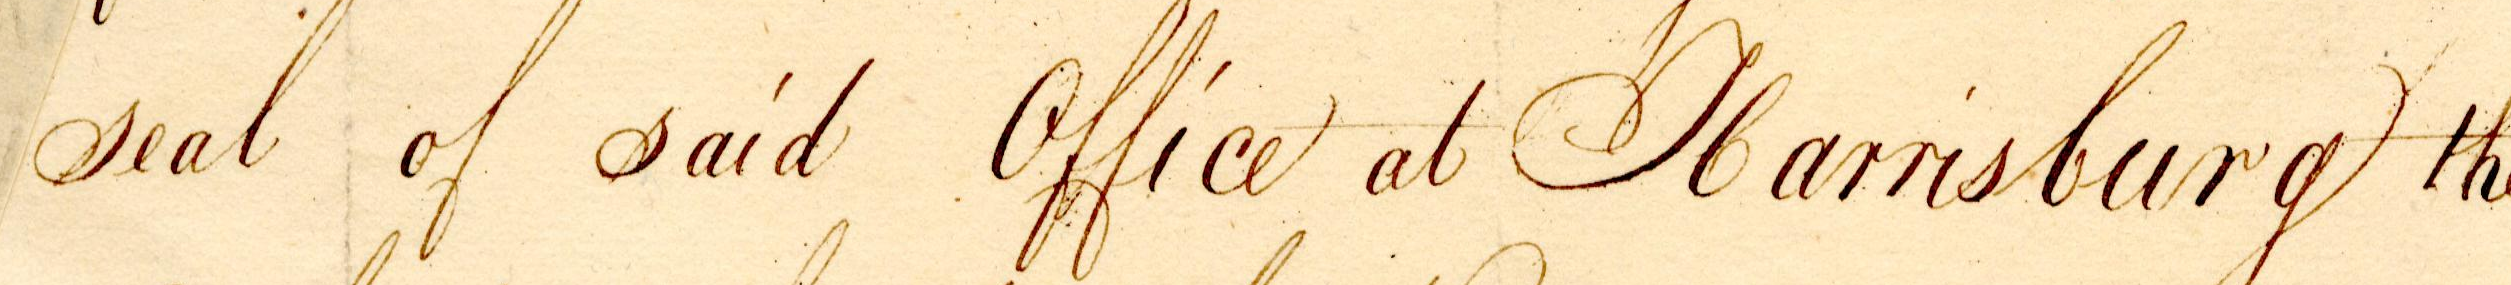seal of said Office at Harrisburg the
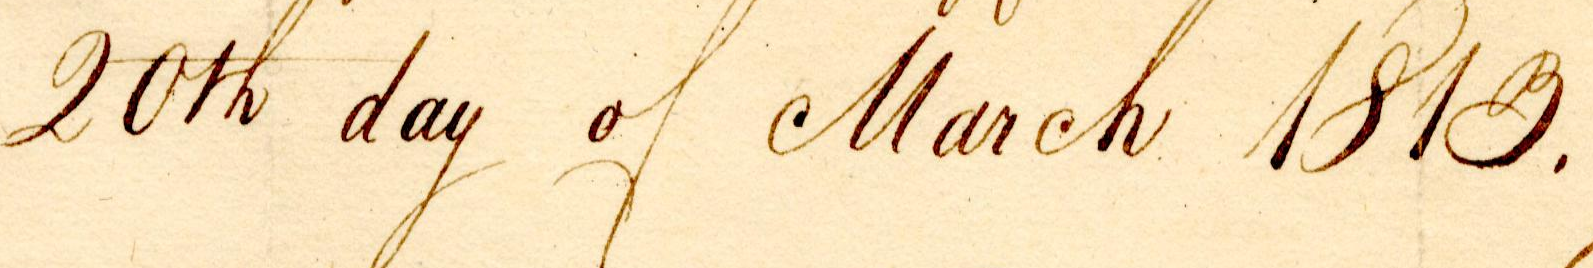20^th day of March 1813.
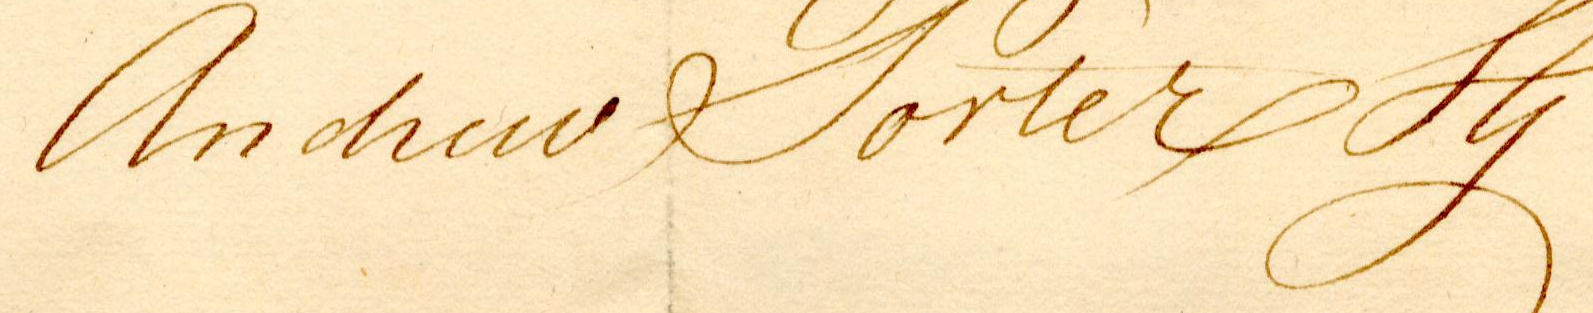Andrew Porter SG
